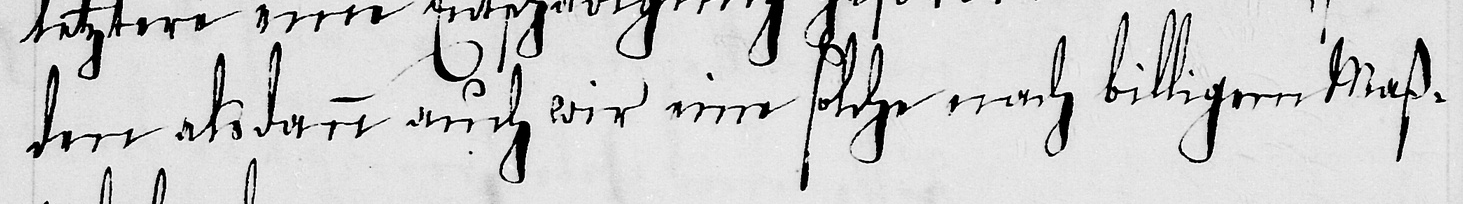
den alsdann auch wir eine solche nach billigem Maß¬
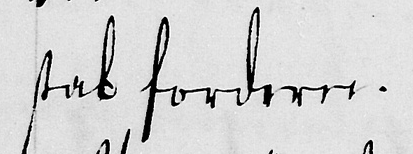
stab fordern.
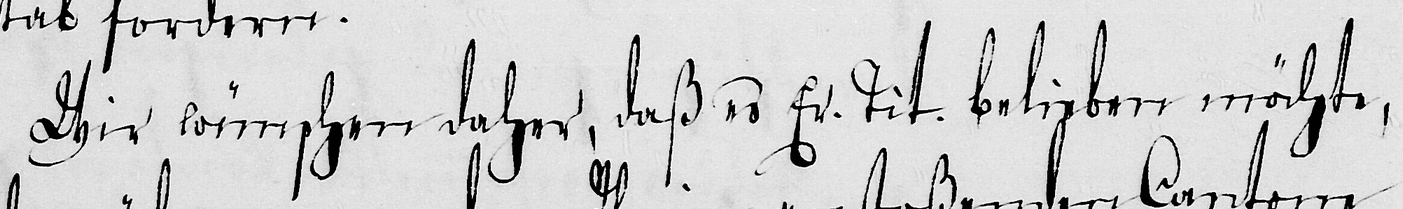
Wir wünschen daher, daß es Er. Tit. belieben möchte,
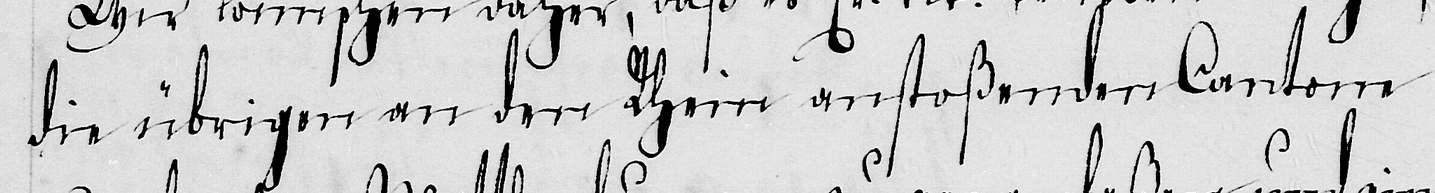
die übrigen an den Rhein anstoßenden Cantone
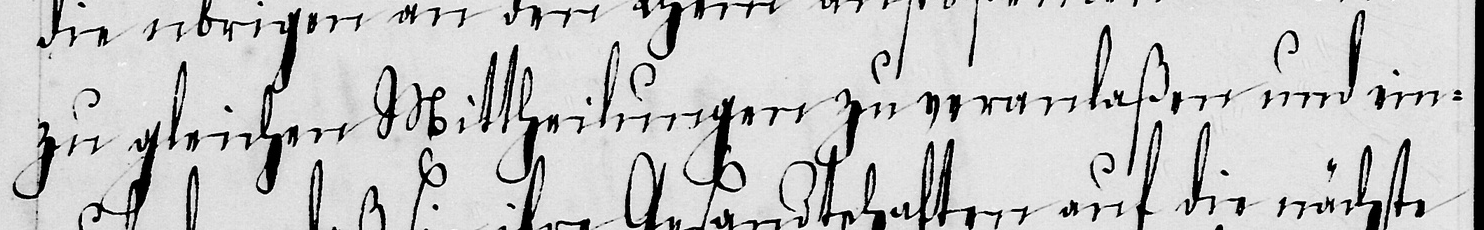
zu gleichen Mittheilungen zu veranlaßen und ein¬
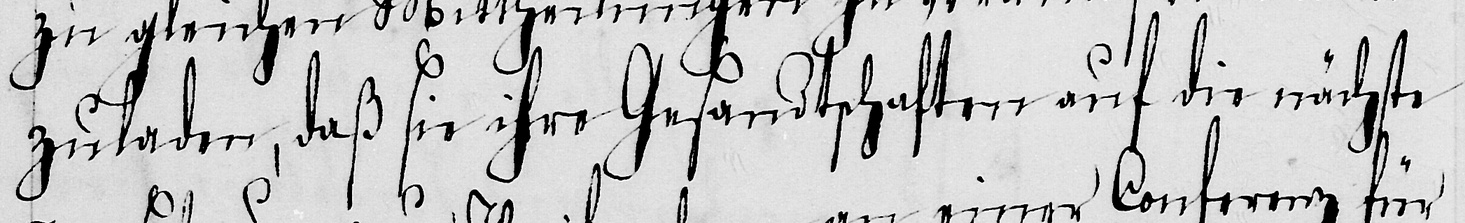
zuladen, daß sie ihre Gesandtschaften auf die nächste
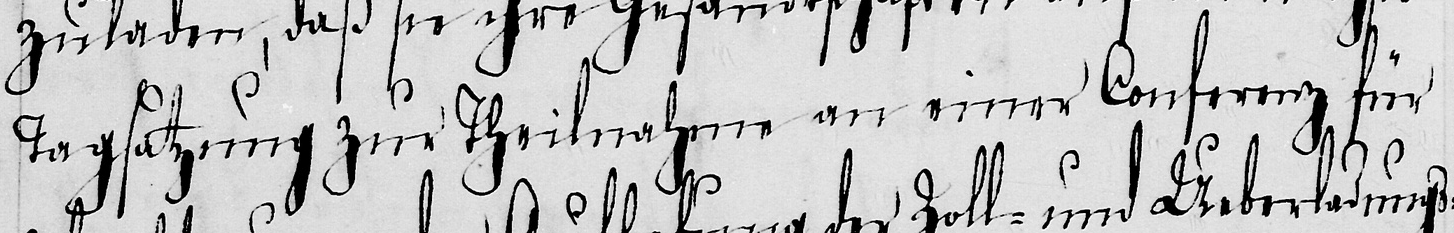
Tagsatzung zur Theilnahme an einer Conferenz für
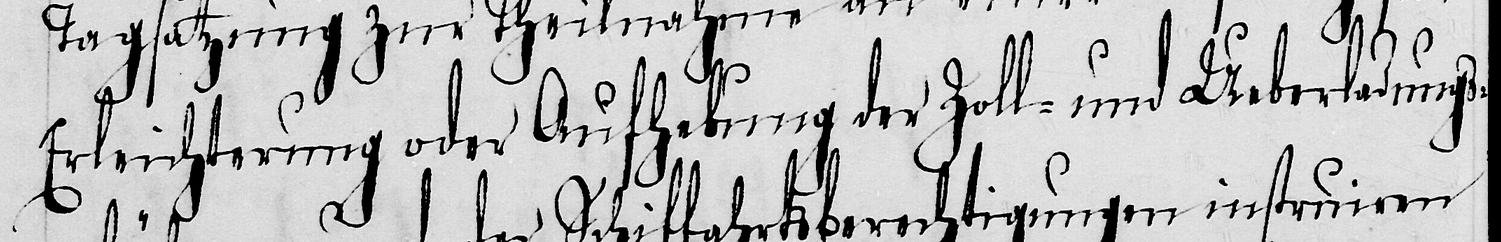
Erleichterung oder Aufhebung der Zoll- und Ueberladung¬
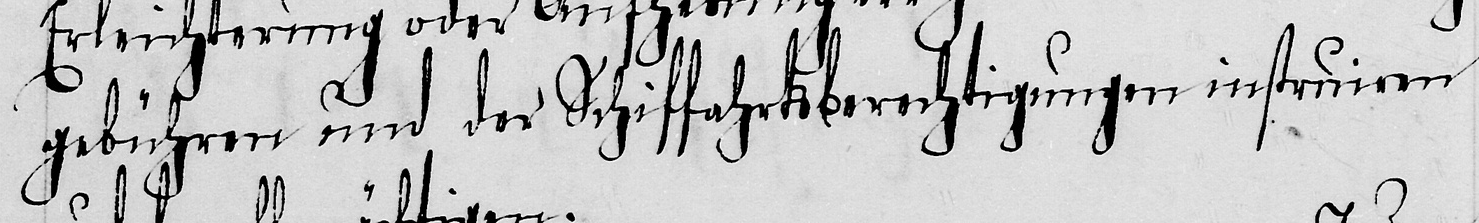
sgebühren und der Schiffahrtsberechtigungen instruiren
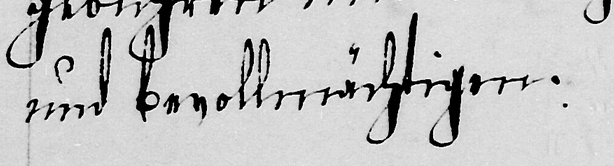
und bevollmächtigen.
